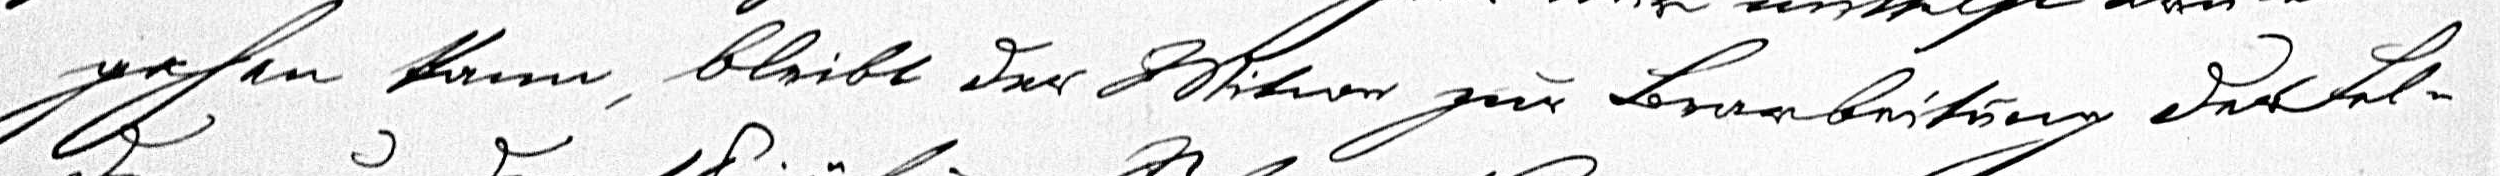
gehen kann, bleibt der Witwe zur Bearbeitung der Fel¬
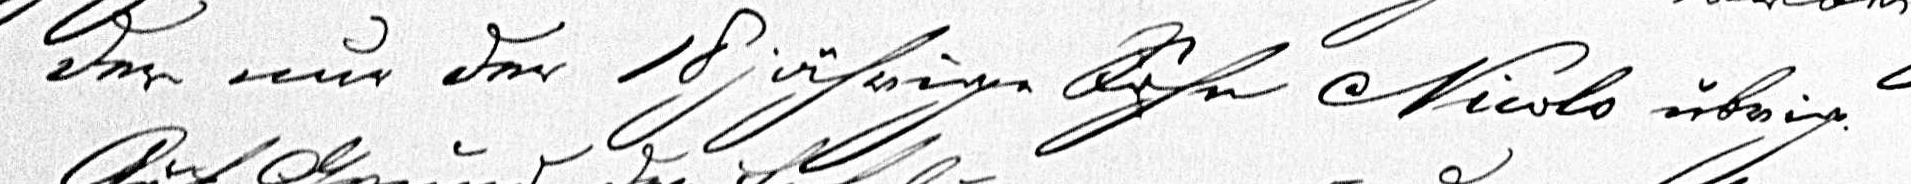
der nur der 18jährigen Sohn Nicolo übrig.
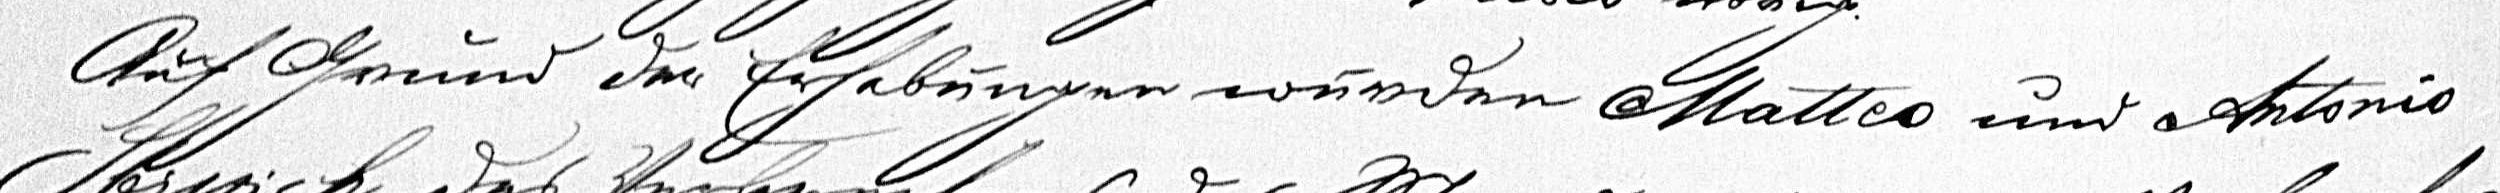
Auf Grund der Erhebungen wurden Matteo und Antonio
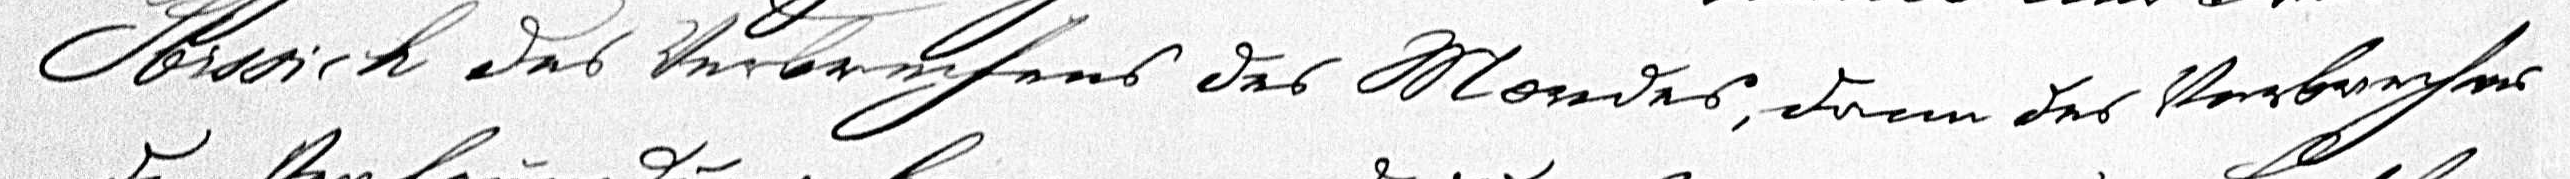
Sbissich des Verbrechens des Mordes, dann des Verbrechens
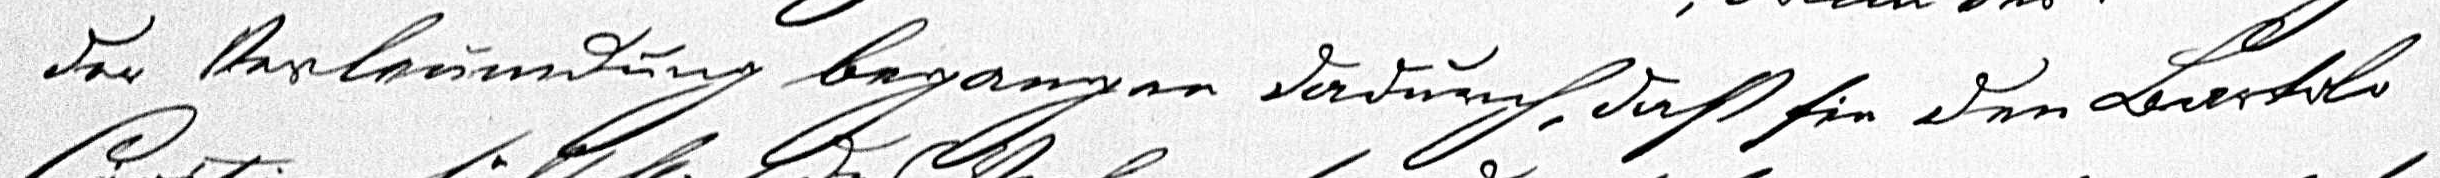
der Verleumundung begangen dadurch, daß sie den Bartolo
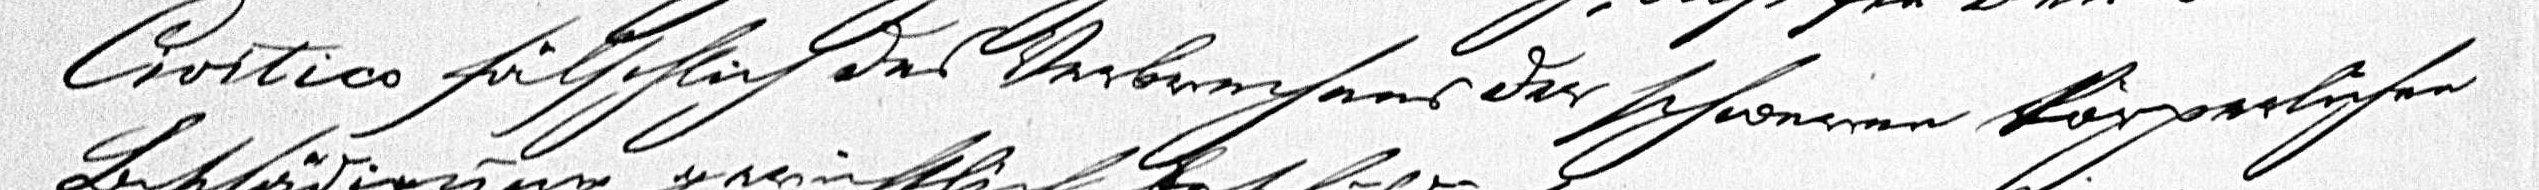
Civitico fälschlich des Verbrechens der schweren körperlichen
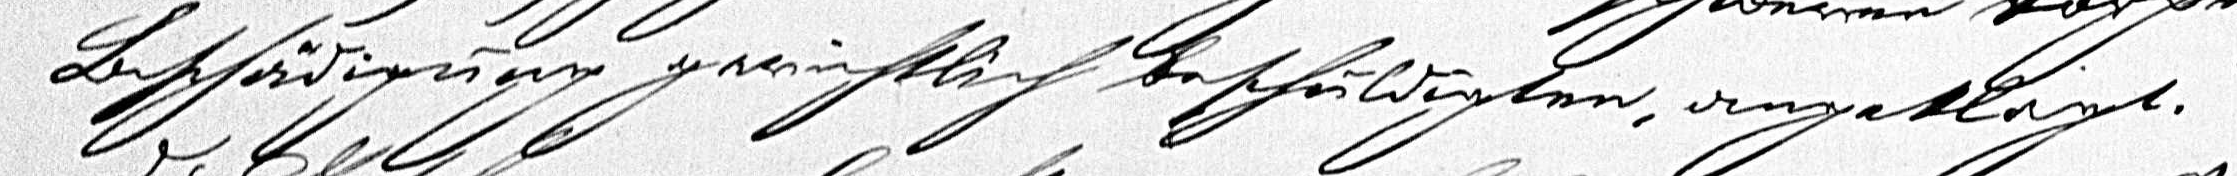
Beschädigung gerichtlich beschuldigten, angeklagt.
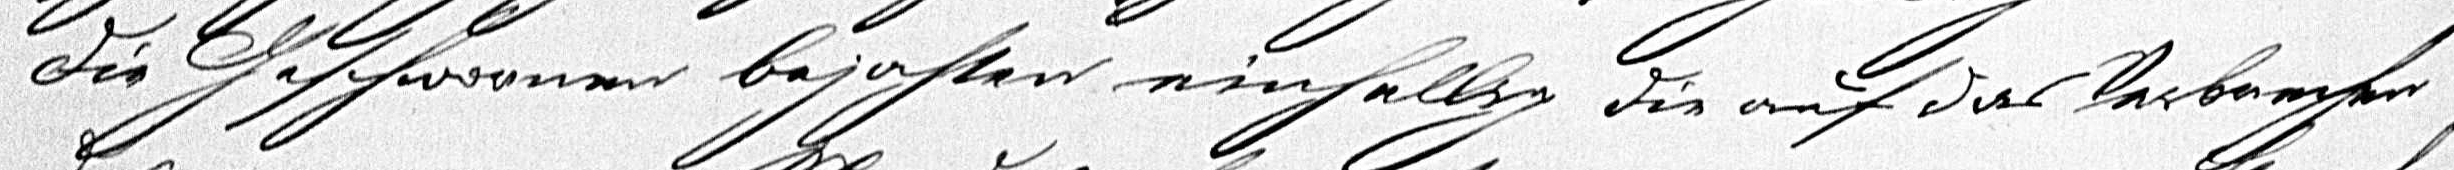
Die Geschworene bejahten einhellig die auf das Verbrechen
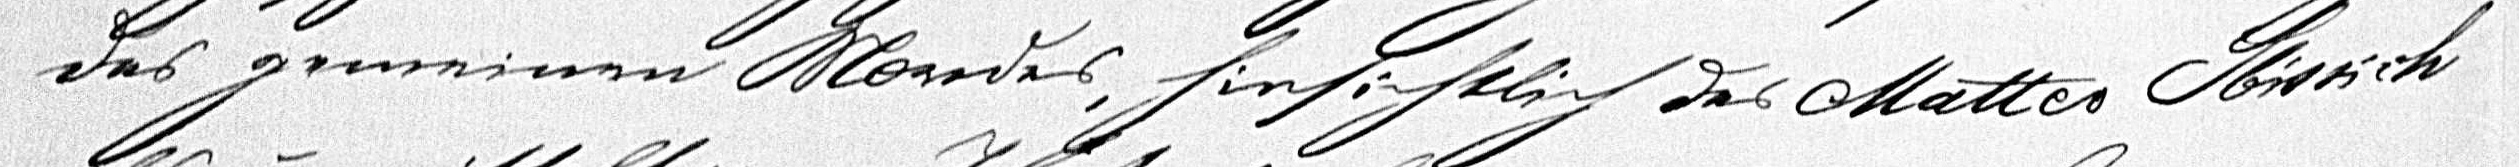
des gemeinen Mordes, hinsichtlich des Matteo Sbissich
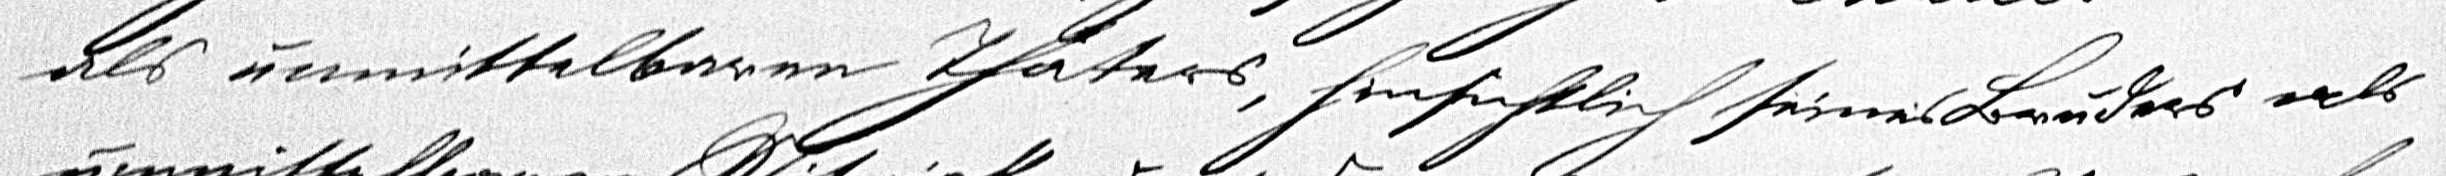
als unmittelbaren Thäters, hinsichtlich seines Bruders als
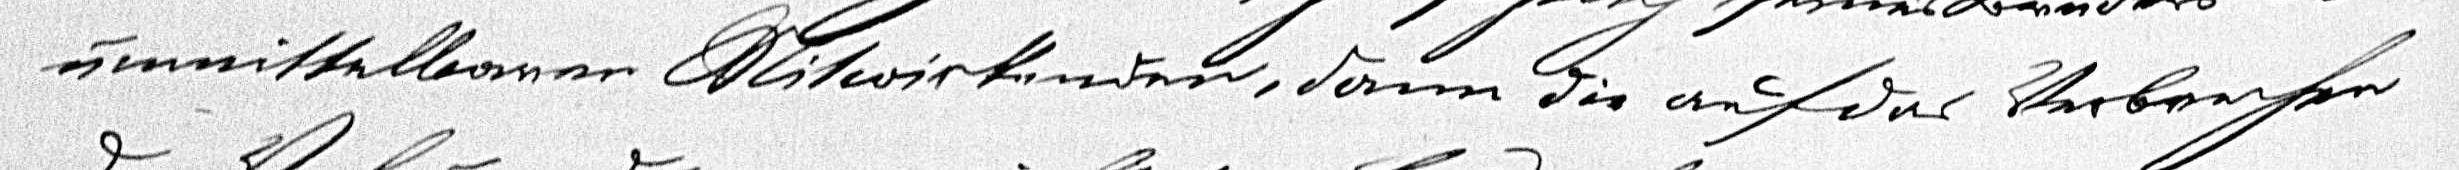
unmittelbaren Mitwirkenden, dann die auf das Verbrechen
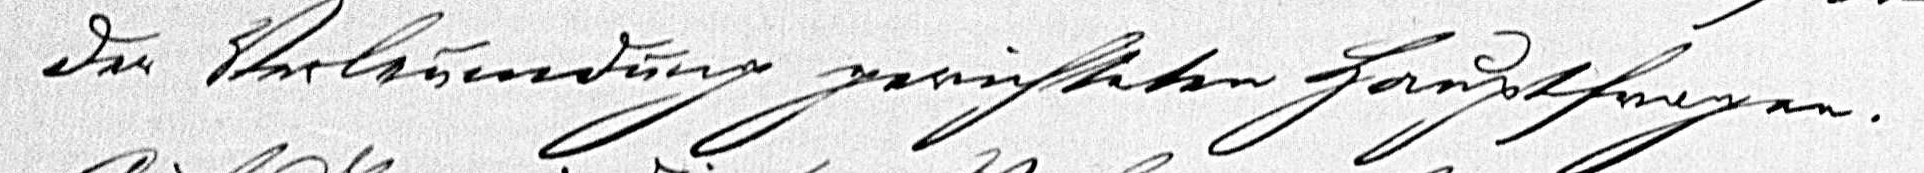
der Verleumdung gerichteten Hauptfragen.
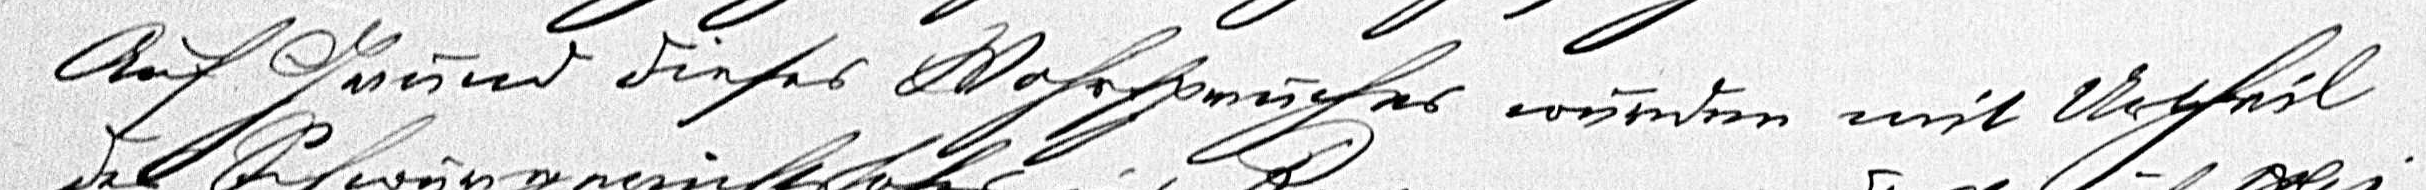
Auf Grund dieses Wahrspruches wurden mit Urtheil
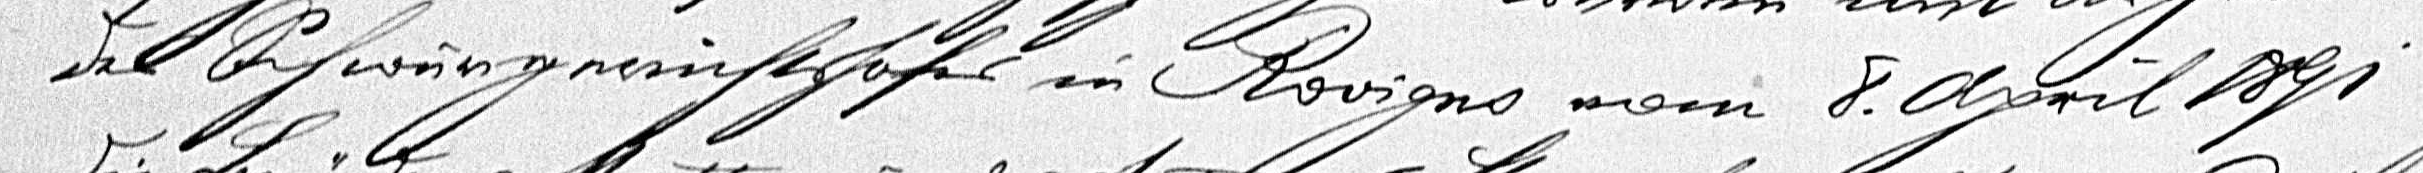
des Schwurgerichtshofes in Rovigno vom 8. April 1891
